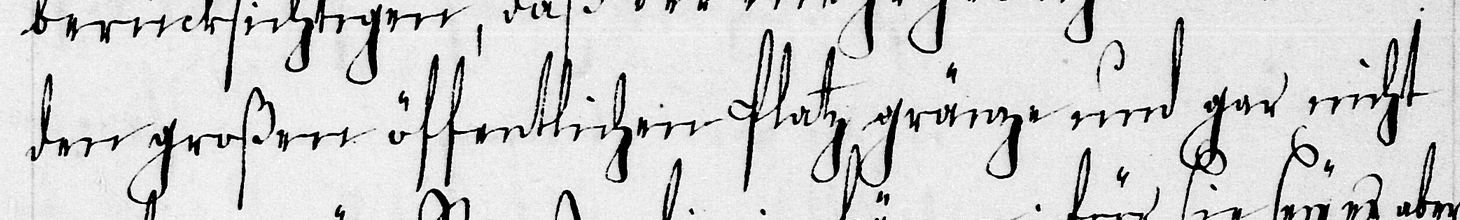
den großen öffentlichen Platz gränze und gar nicht
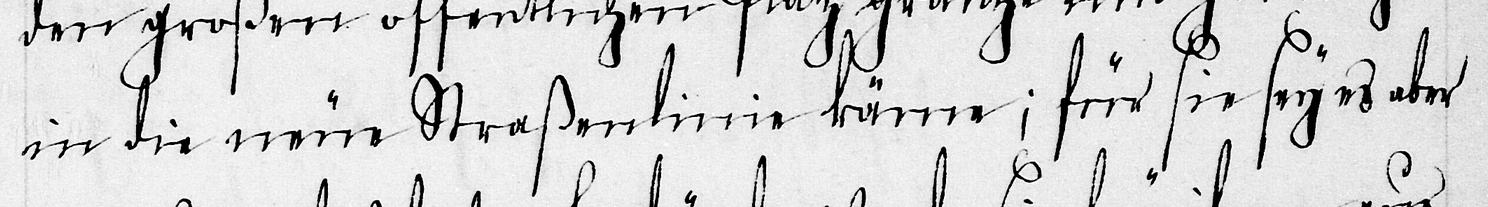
in die neue Straßenlinie käme; für sie sey es aber
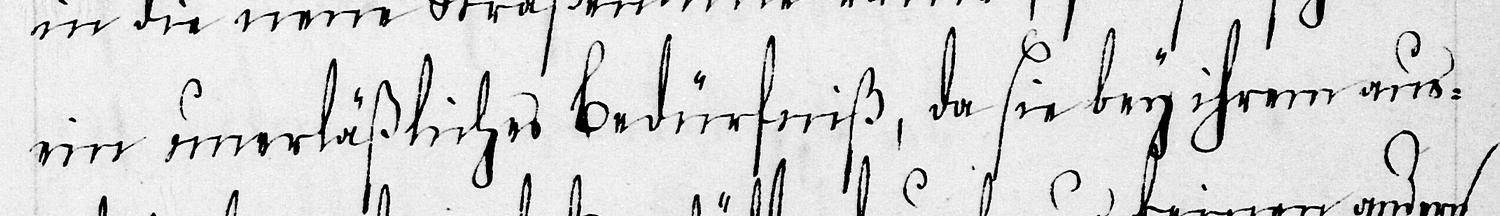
ein unerläßliches Bedürfniß, da sie bey ihrem aus¬
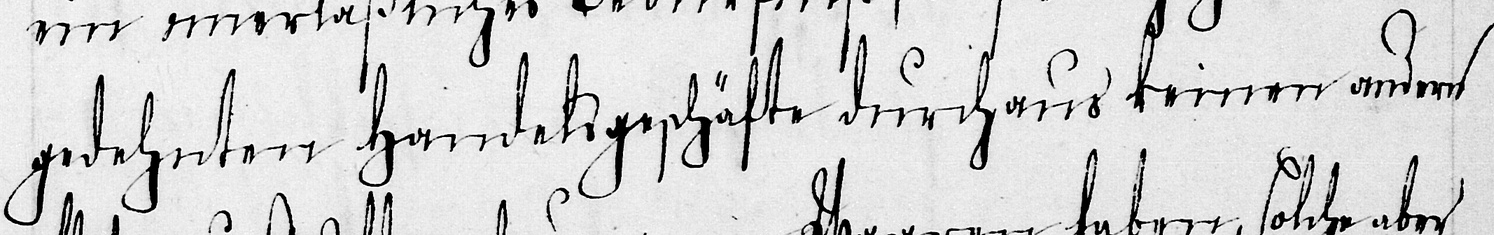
gedehnten Handelsgeschäfte durch aus keinen andern
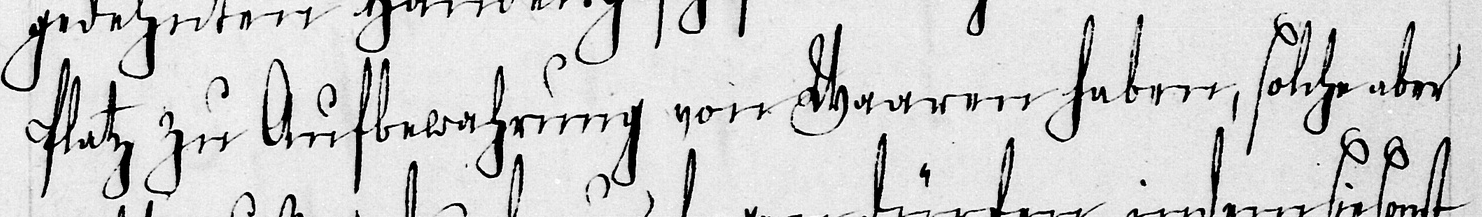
Platz zu Aufbewahrung von Waaren haben, solche aber
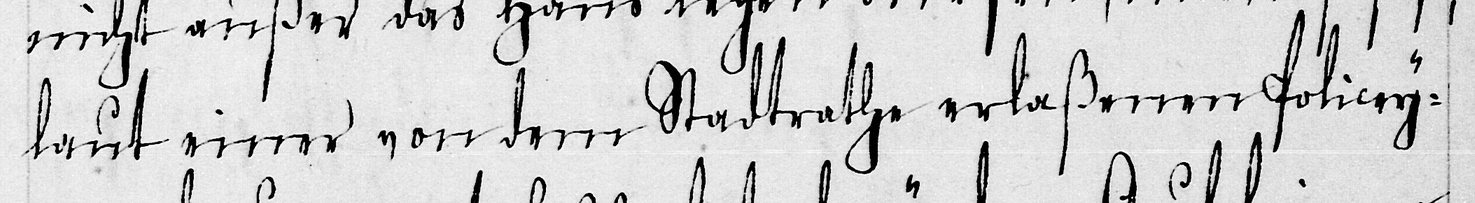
laut einer von dem Stadtrathe erlaßenen Policey¬
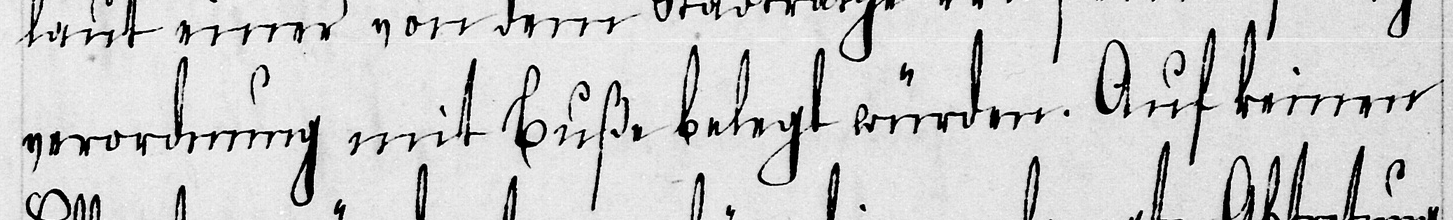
verordnung mit Buße belegt würden. Auf keinen
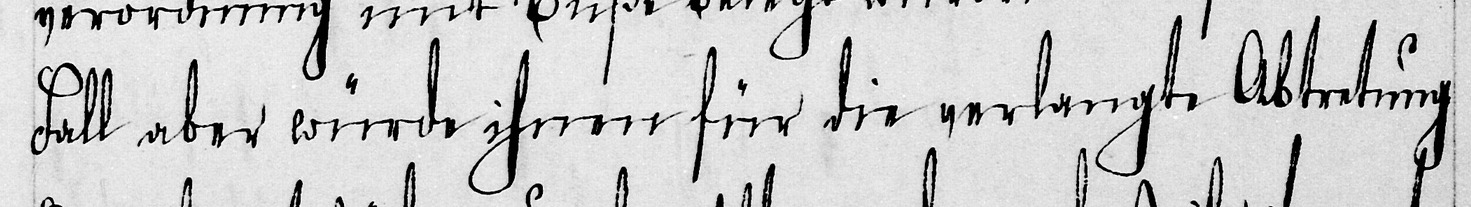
Fall aber würde ihnen für die verlangte Abtretung
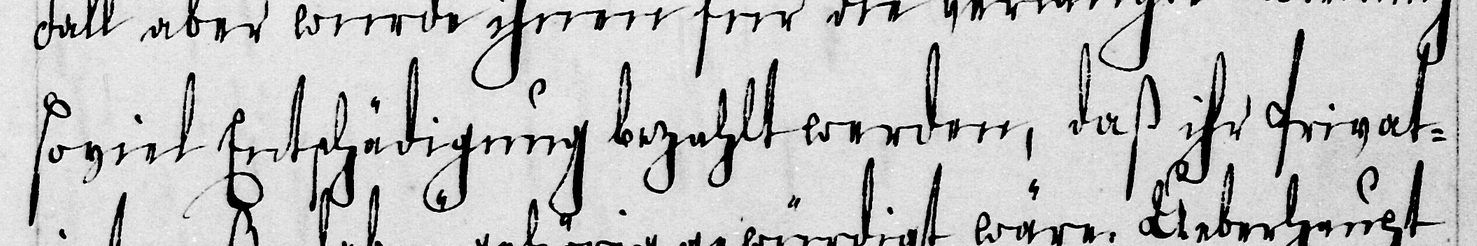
soviel Entschädigung bezahlt werden, daß ihr Privat¬
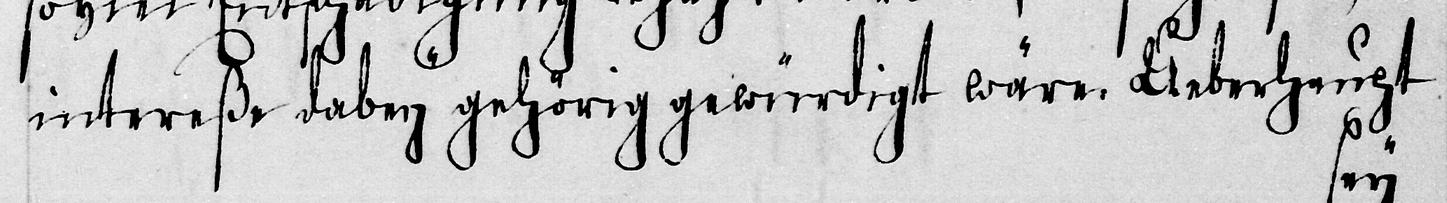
intereße dabey gehörig gewürdigt wäre. Ueberhaupt
